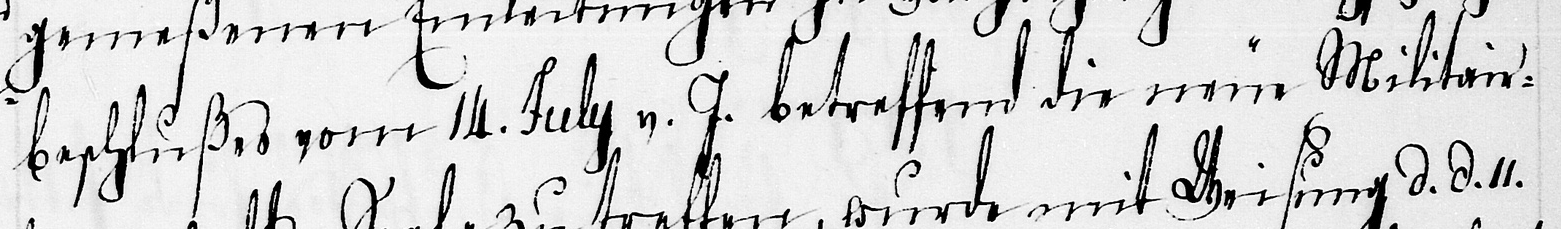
beschlußes vom 14. July v. J. betreffend die neue Militai¬
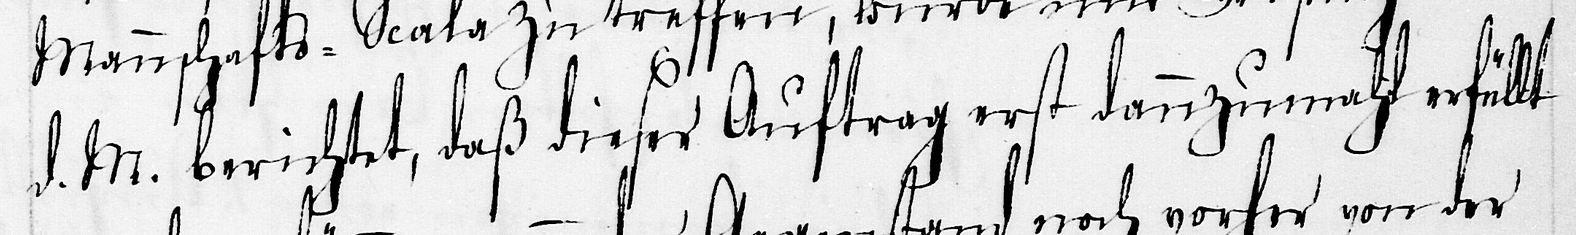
d. M. berichtet, daß dieser Auftrag erst dannzumahl erfüllt
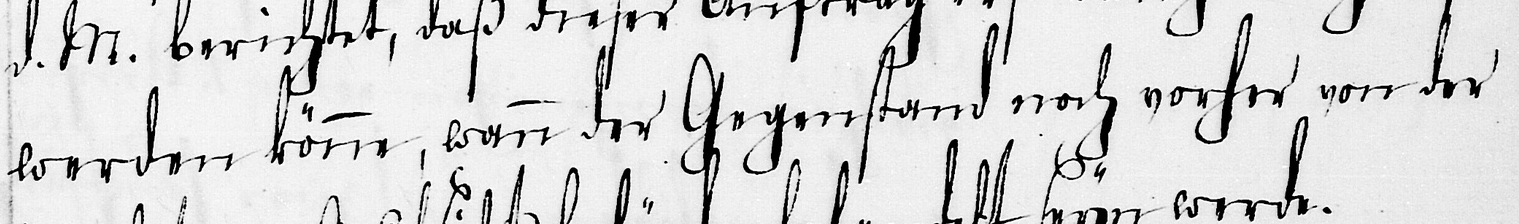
werden könne, wann der Gegenstand noch vorher von der
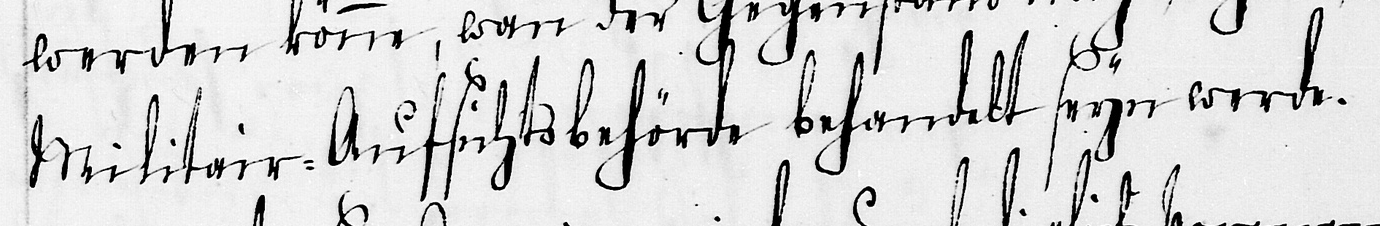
Militair-Aufsichtsbehörde behandelt seyn werde.
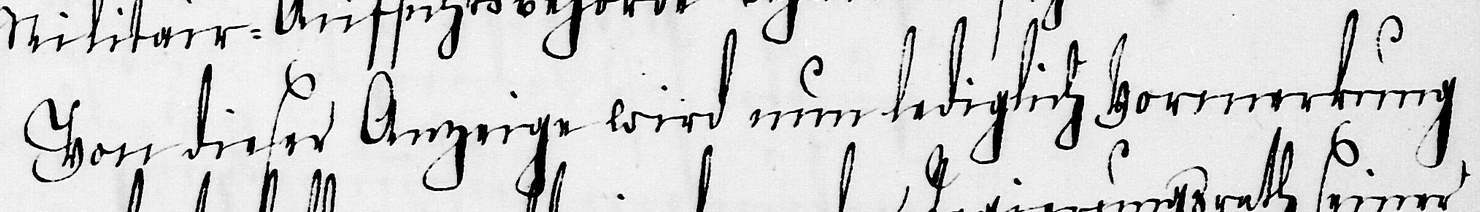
Von dieser Anzeige wird nun lediglich Vormerkung
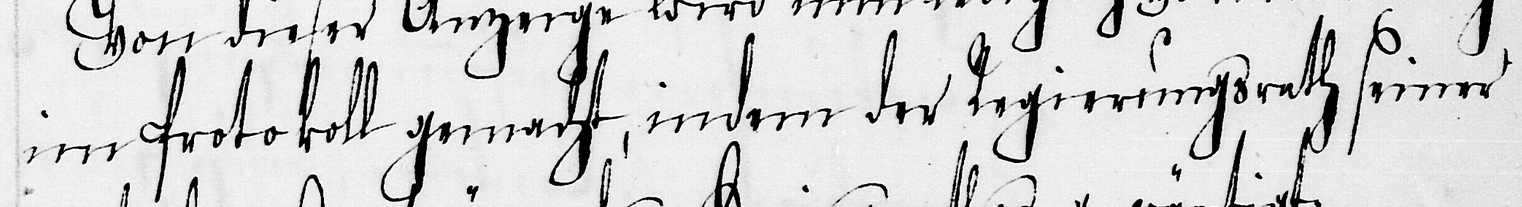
im Protokoll gemacht, indem der Regierungsrath seiner
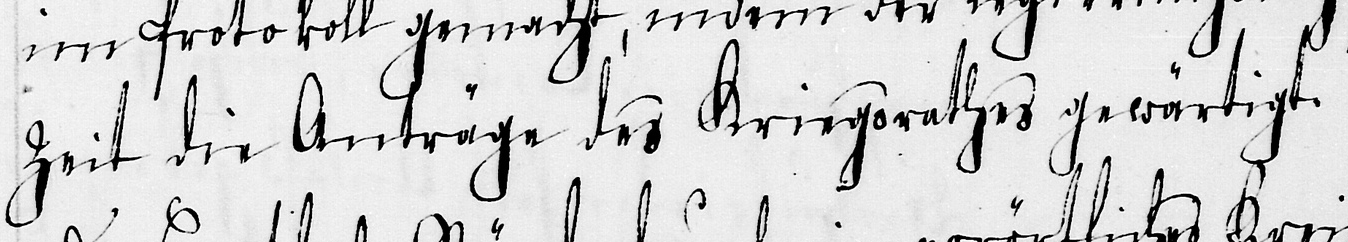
Zeit die Anträge des Kriegsrathes gewärtigt.
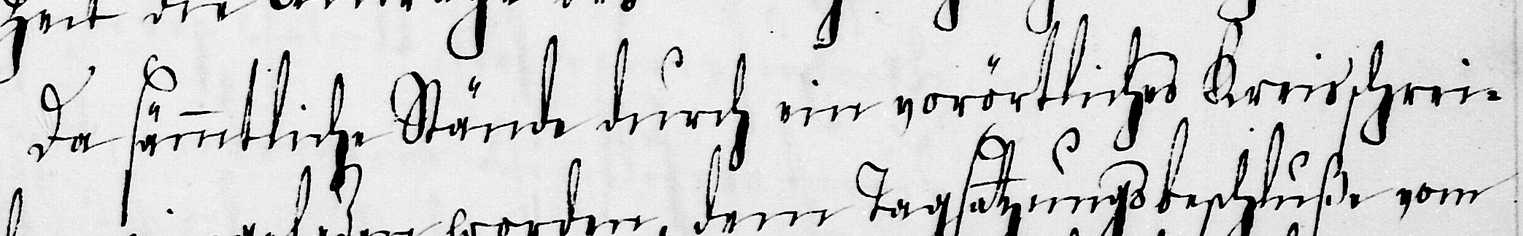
Da sämmtliche Stände durch ein vorörtliches Kreisschrei¬
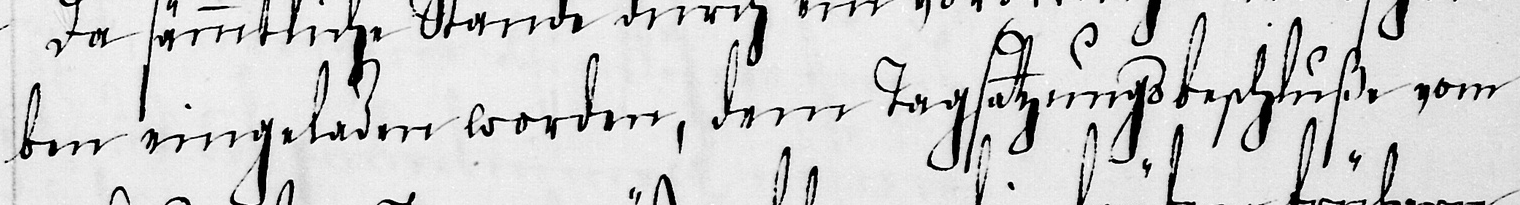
ben eingeladen worden, dem Tagsatzungsbeschluße vom
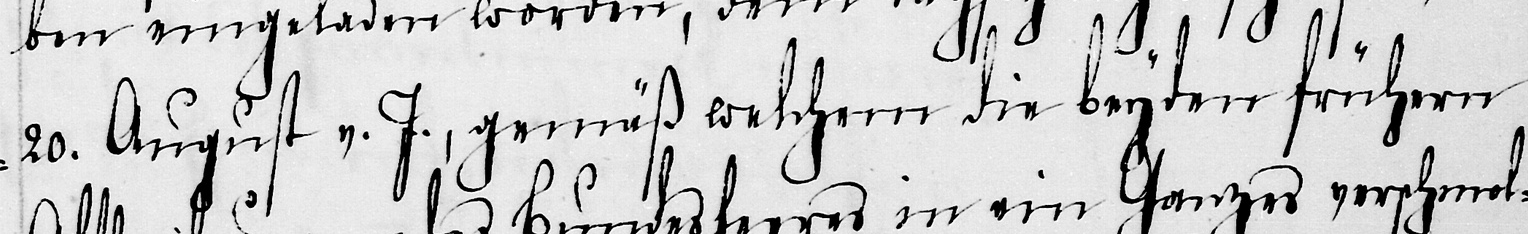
20. August v. J., gemäß welchem die beyden frühern
